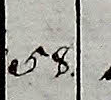58.
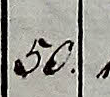50.
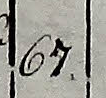67.
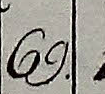69.
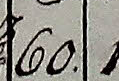60.
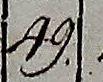49.
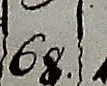68.
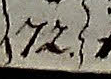72.
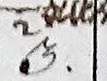3.
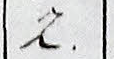2.
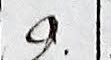9.
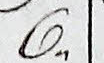6.
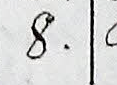8.
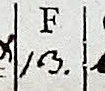13.
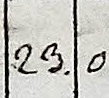23.
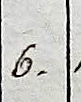6.
